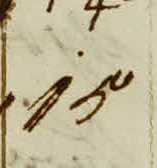15
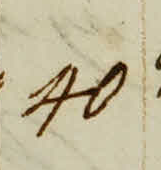40
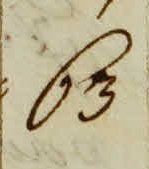63
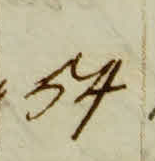54
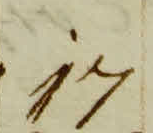17
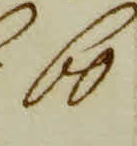60
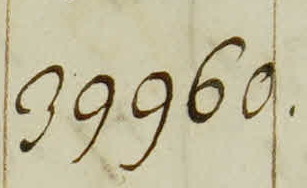39960
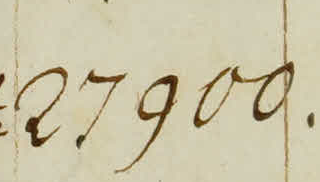27900
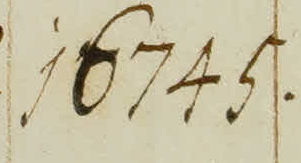16745
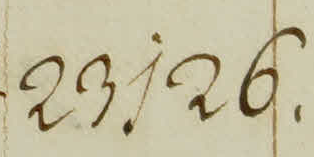23126
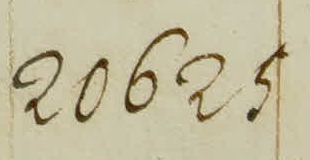20625
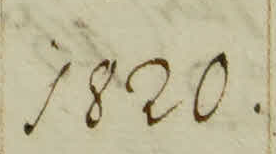1820
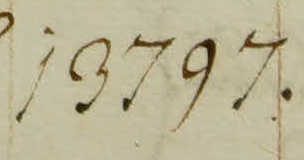13797
